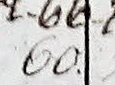60.
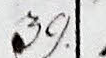39.
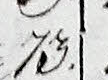73.
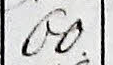60.
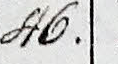46.
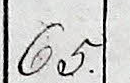65.
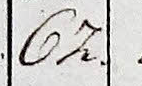62.
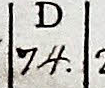74.
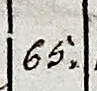65
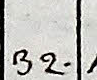32
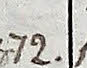72.
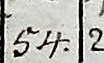54.
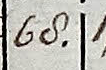68.
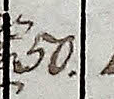50.
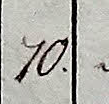70.
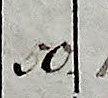50.
